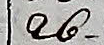26
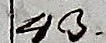43
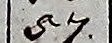57.
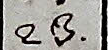23.
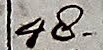48
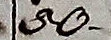50
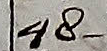48
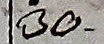30
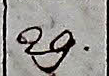29.
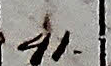41.
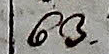63
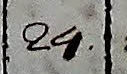24.
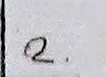2.
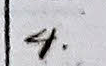4.
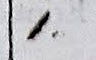1.
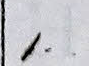1.
